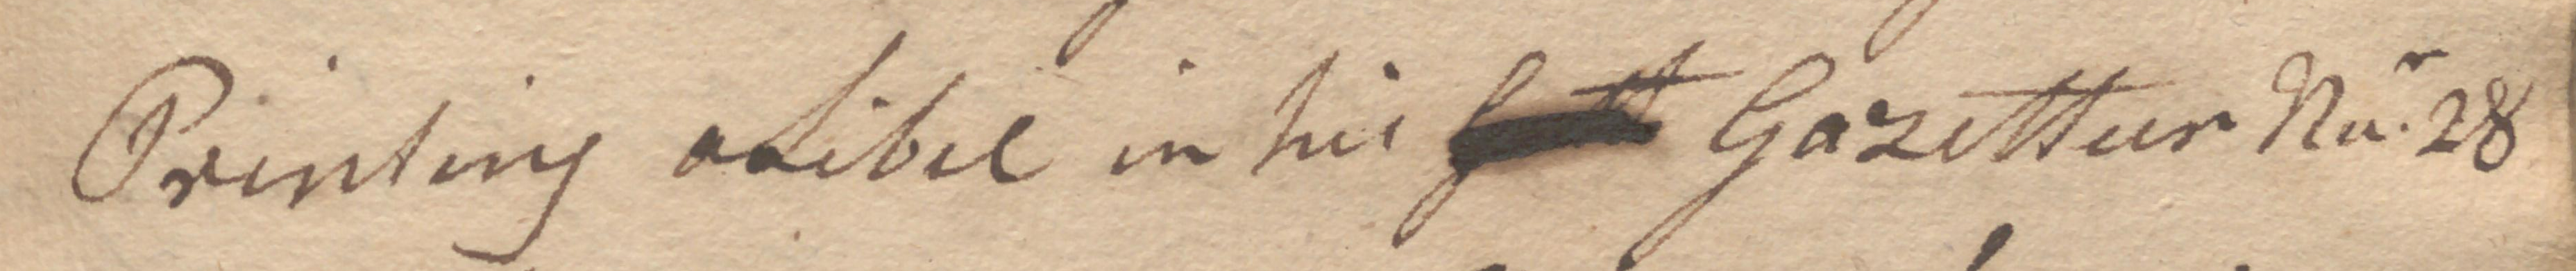Printing a Libel in his [Gatt] Gazetteer Nu^r. 28
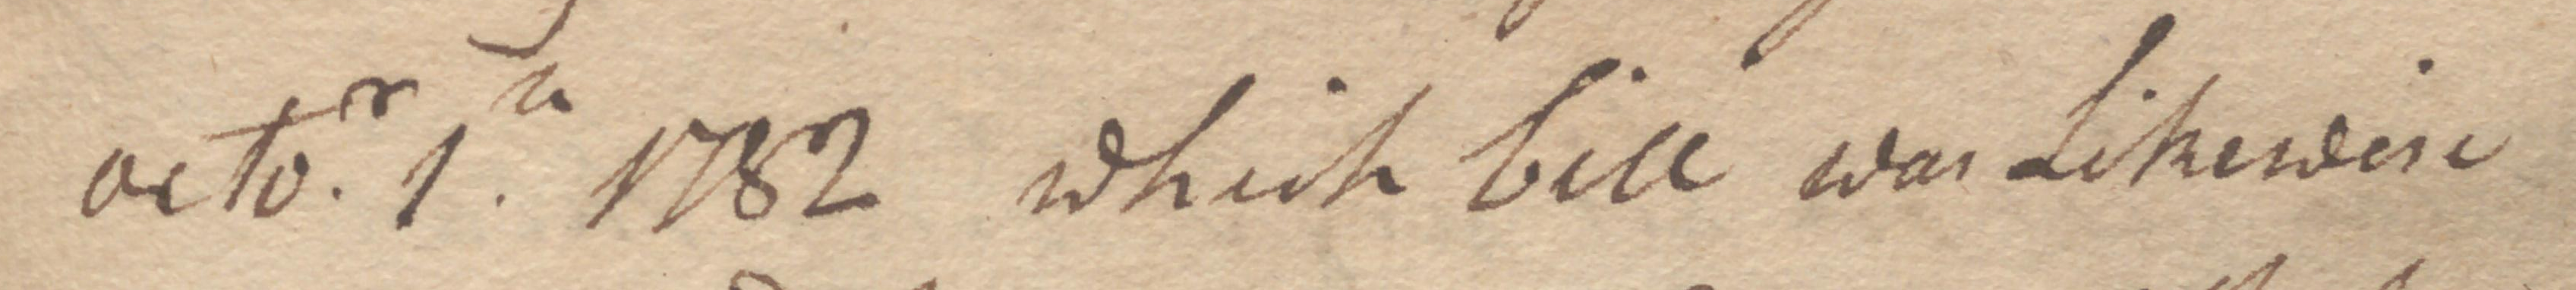octo^r. 1^th. 1782. which bill was Likewise
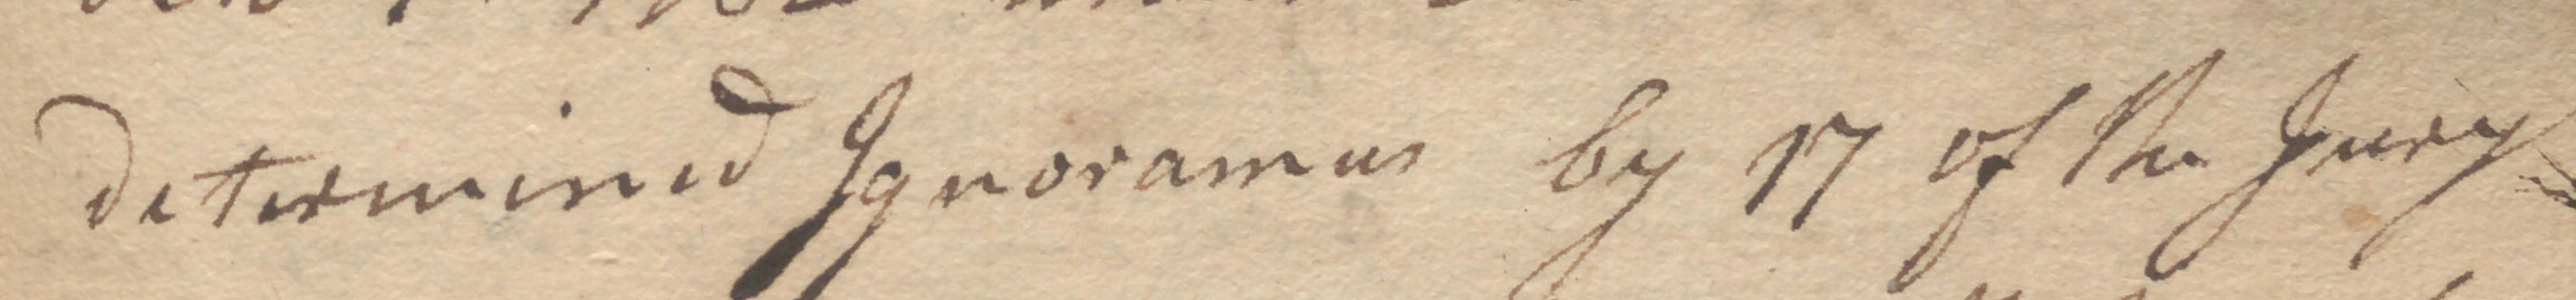determined Ignoramus by 17 of the Jury
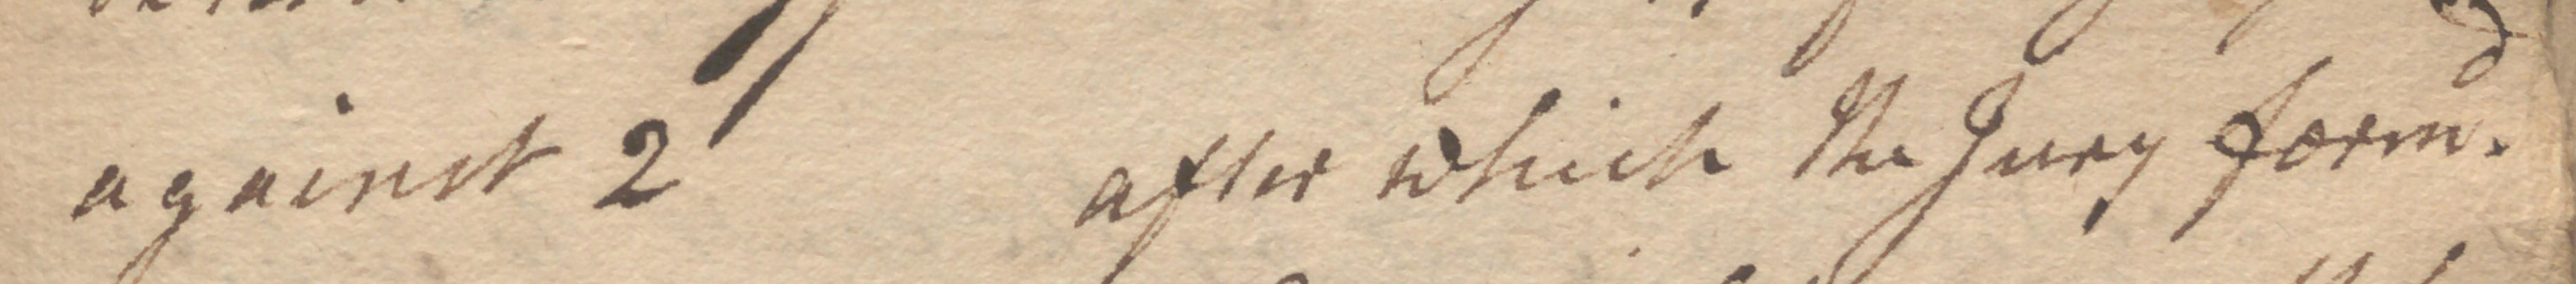against 2 after which the Jury form^d.
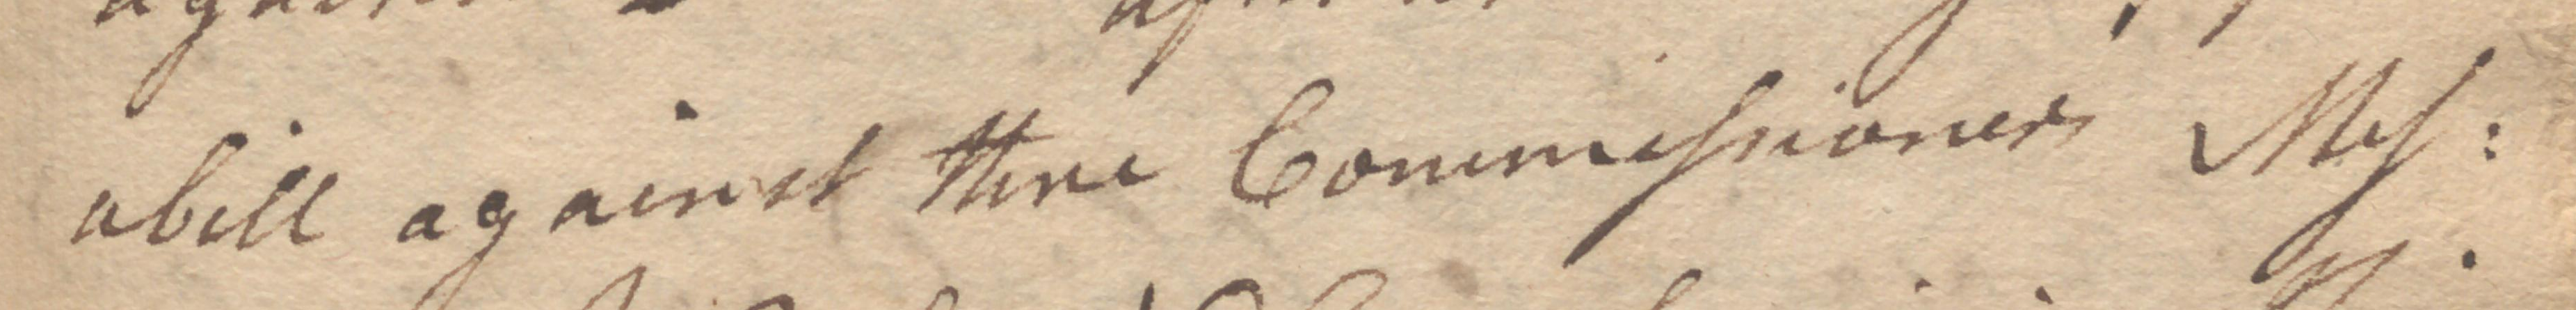a bill against thre Commissioners Me^r:
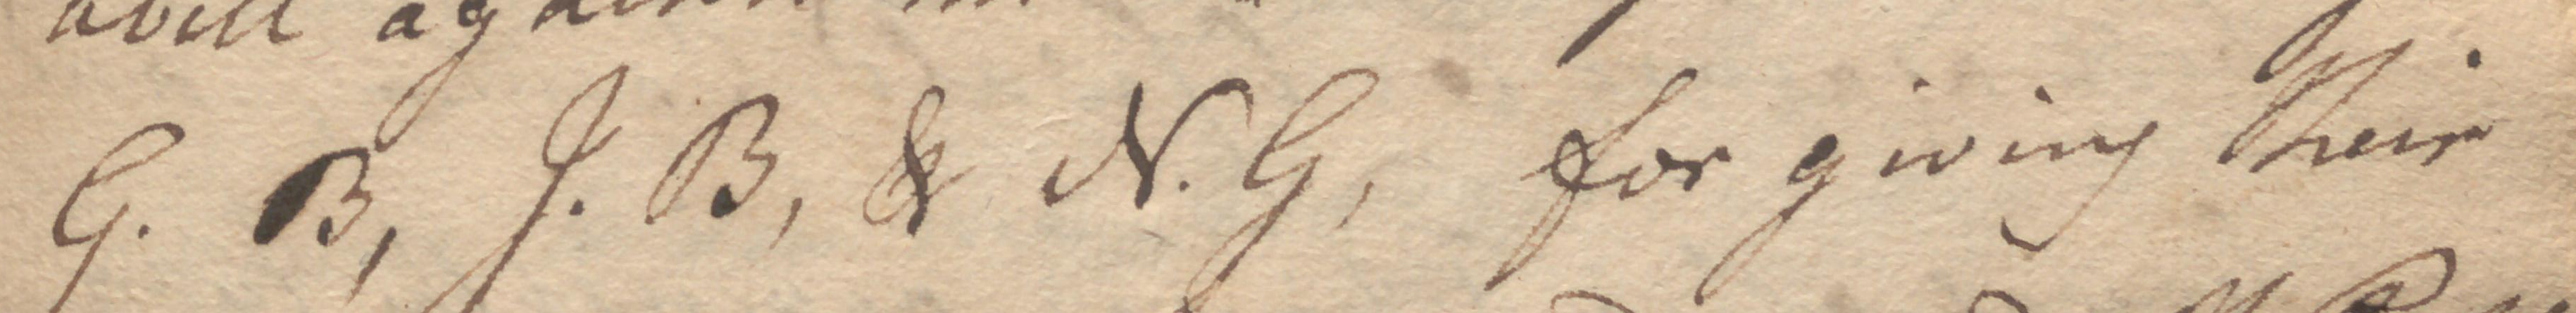G.B. J.B, & N.G, for giving their
